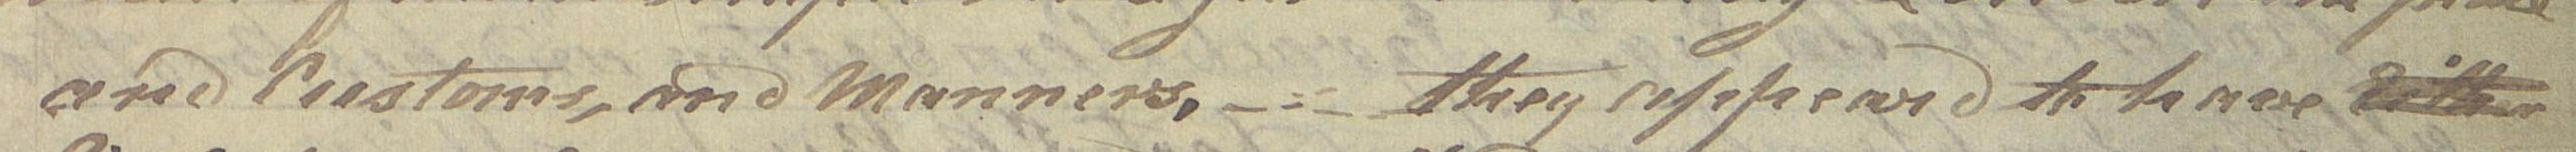and Customs and manners, they appeard to have either
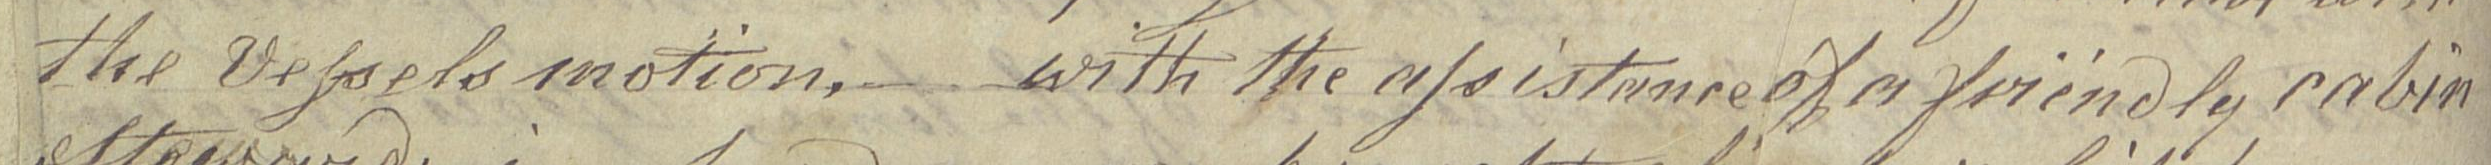the Vessels motion. with the assistance of a friendly cabin
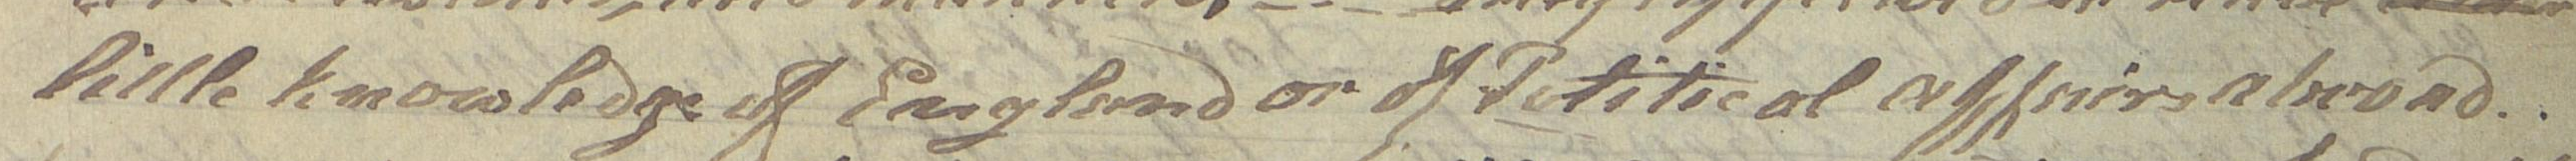little knowledge of England or of Political affairs abroad..
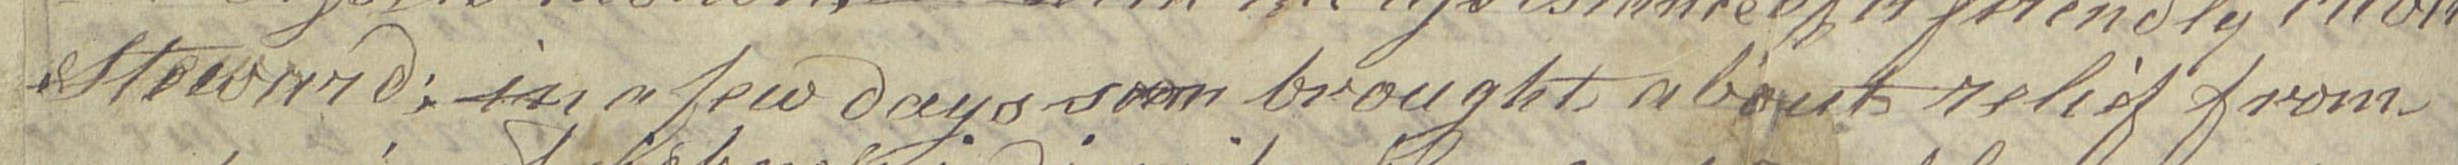steward; in a few days soon brought about relief from
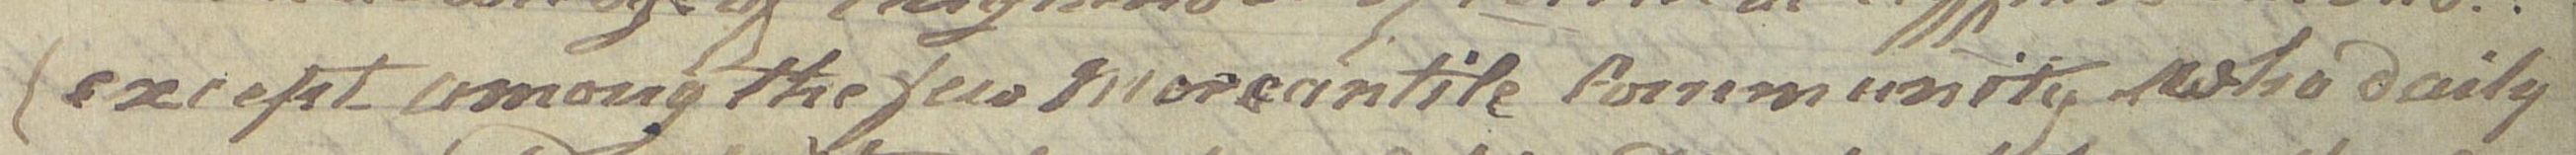(except among the few Mercantile Community who daily
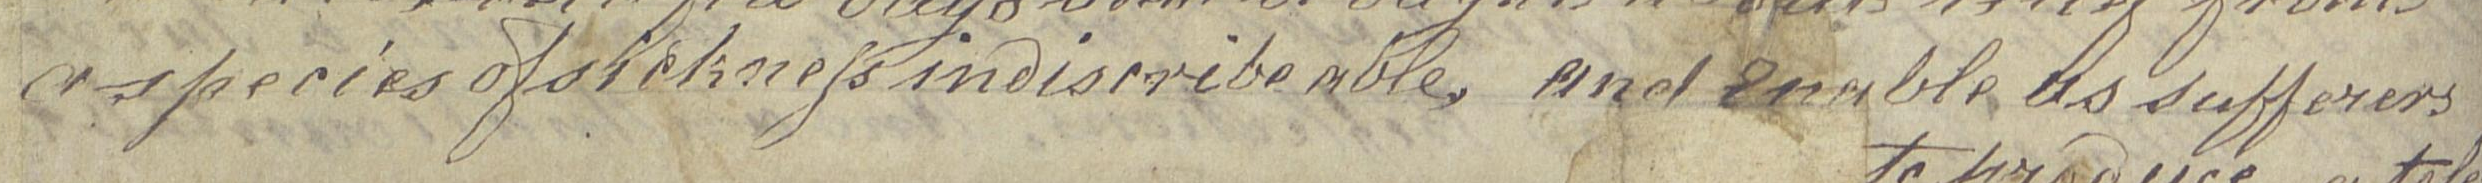a species of sickness indiscribeable and enable us sufferers
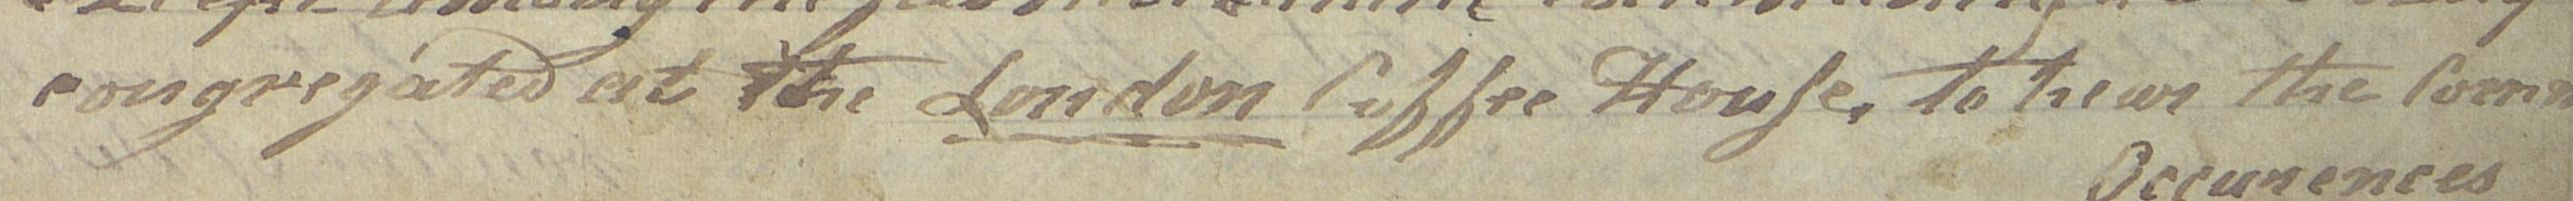congregated at the London Coffee House, to hear the Common
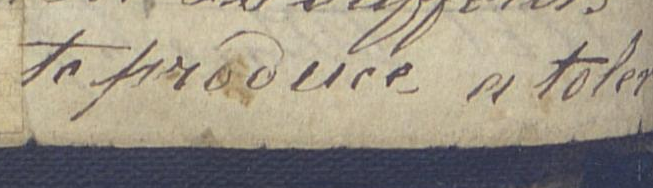to produce a tolerab-
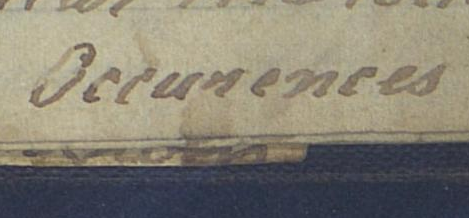Occurences
